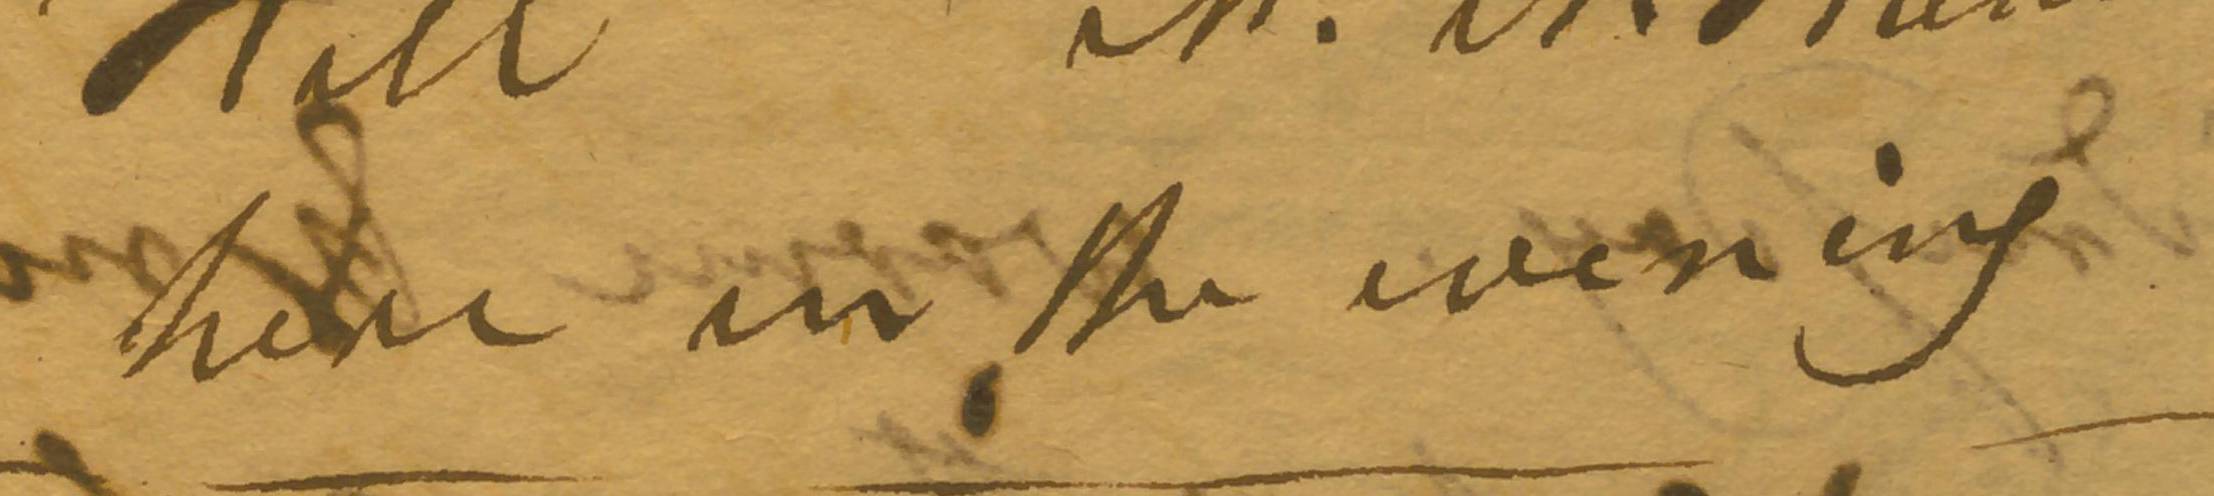hise in the evening
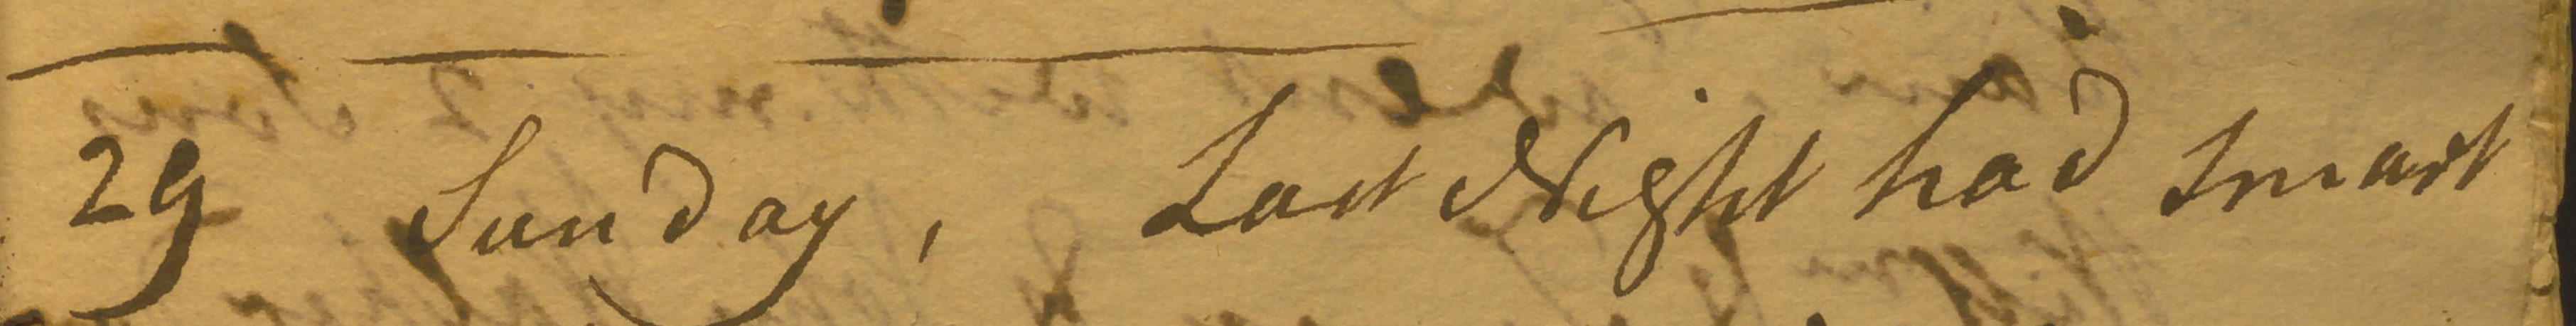29 Sunday, Last Night had smart
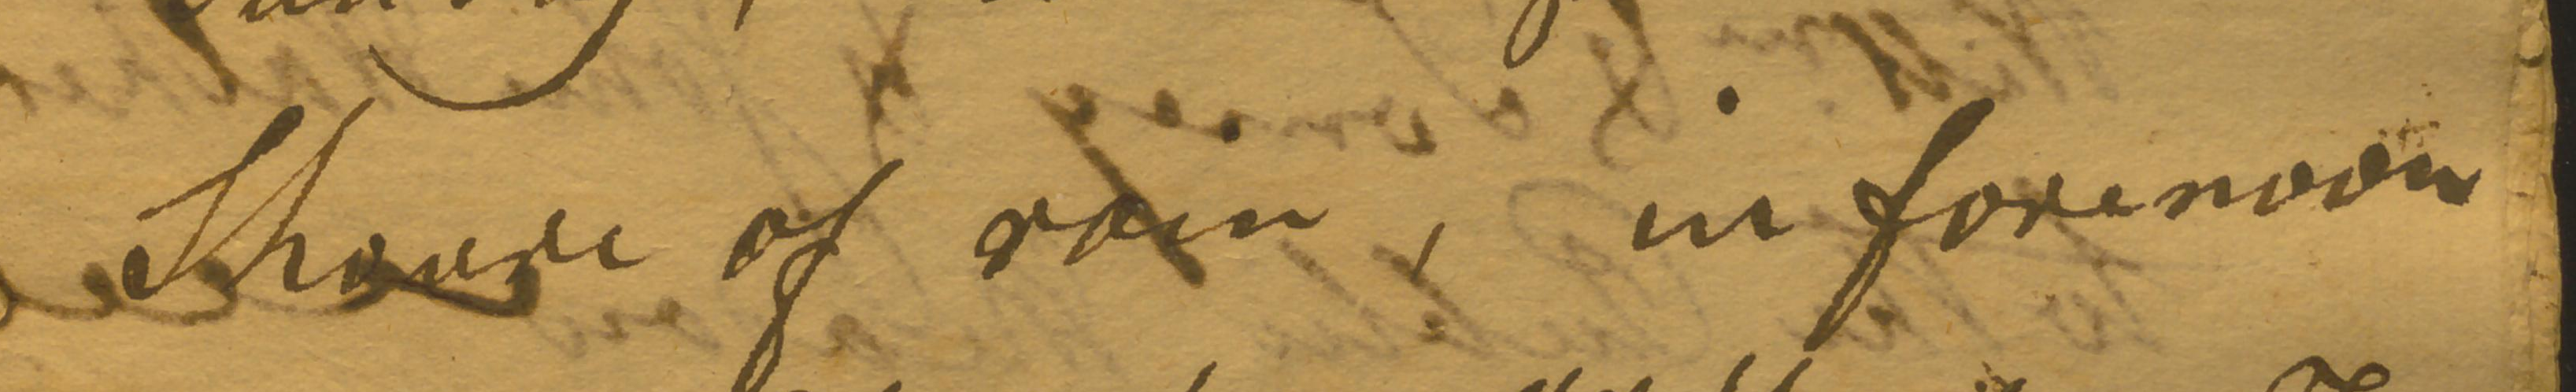shoure of rain, in forenoon
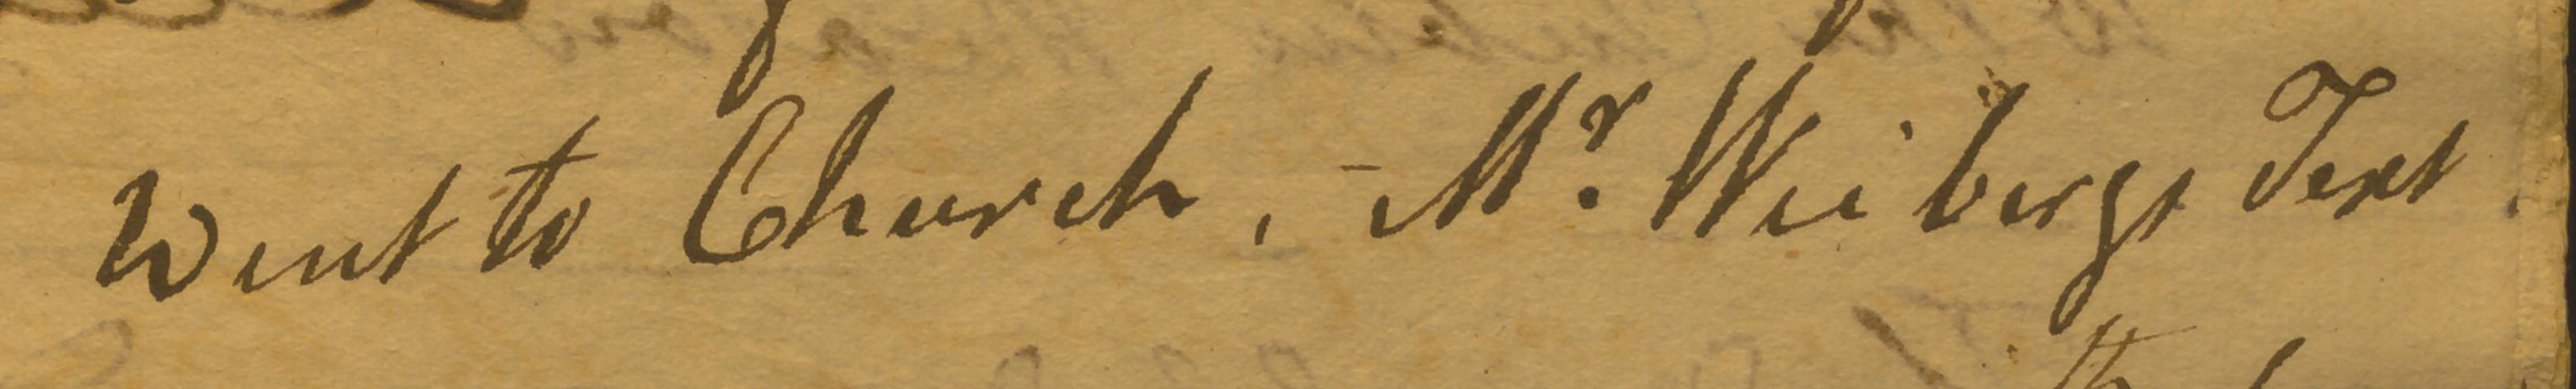went to Church, M^r. Weibergs Text
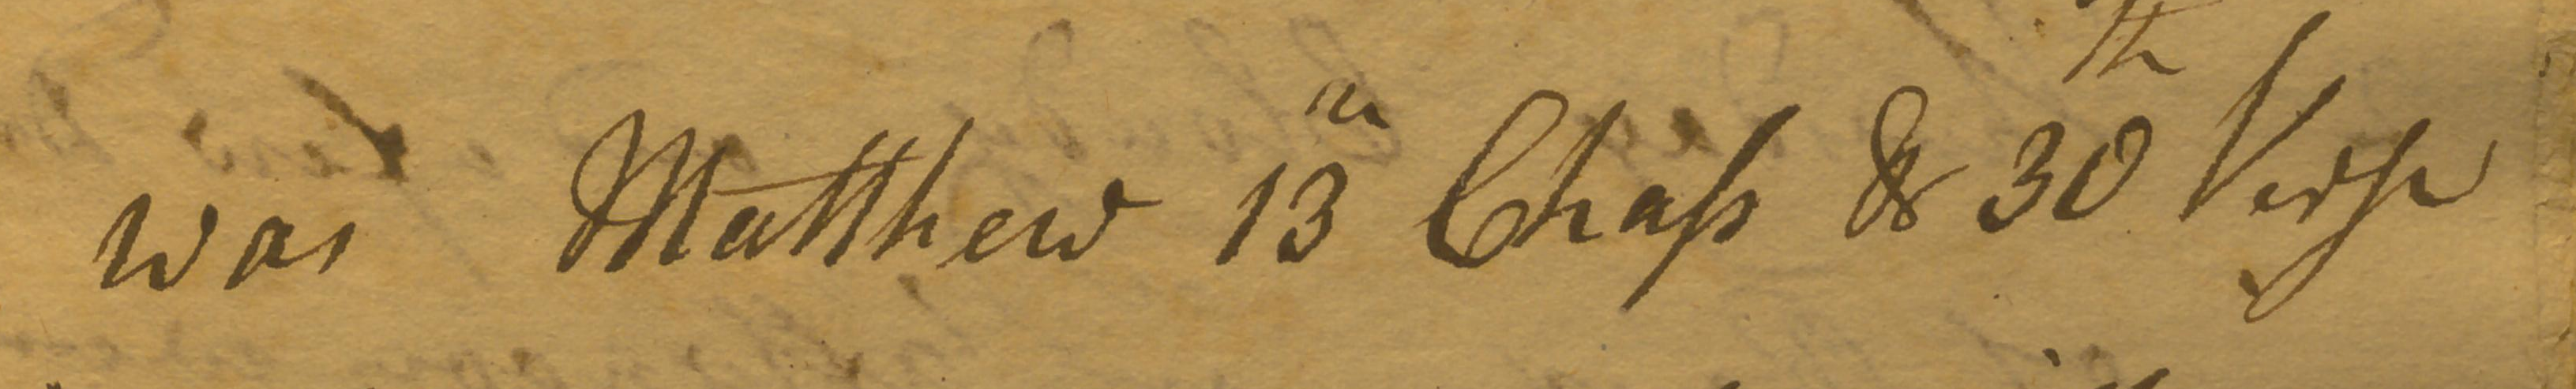was Matthew 13^th Chaps & 30^th Verse
